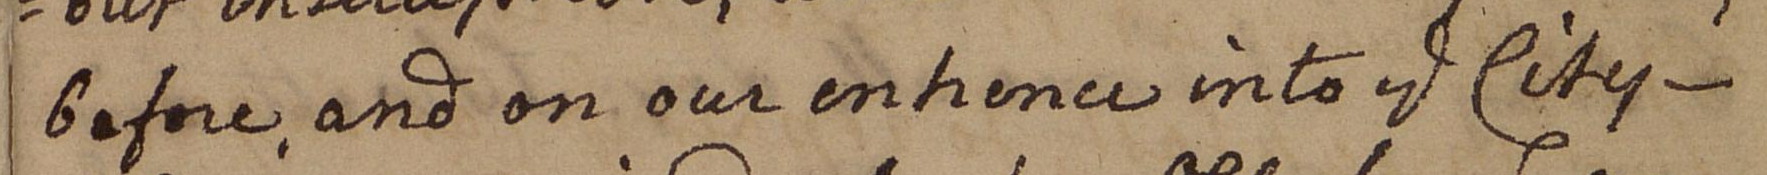before, and on our entrence into y^e City-
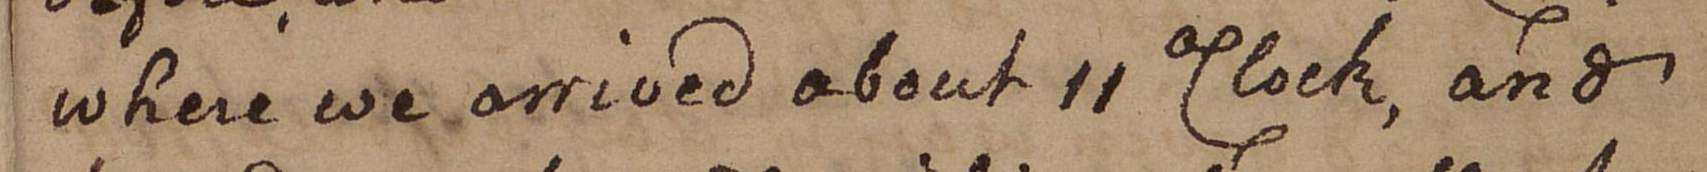where we arrived about 11 ^o Clock, and
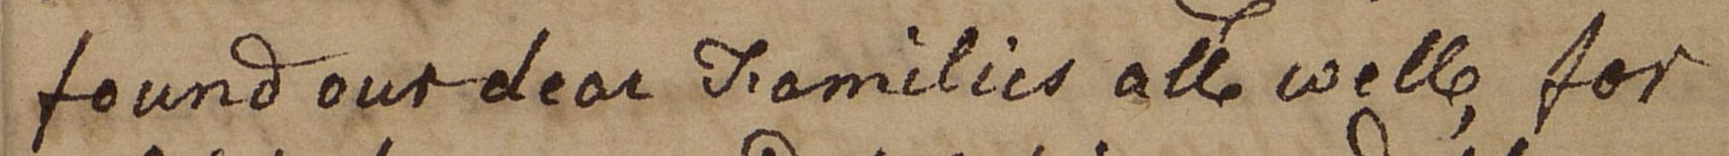found our dear Families all well, for
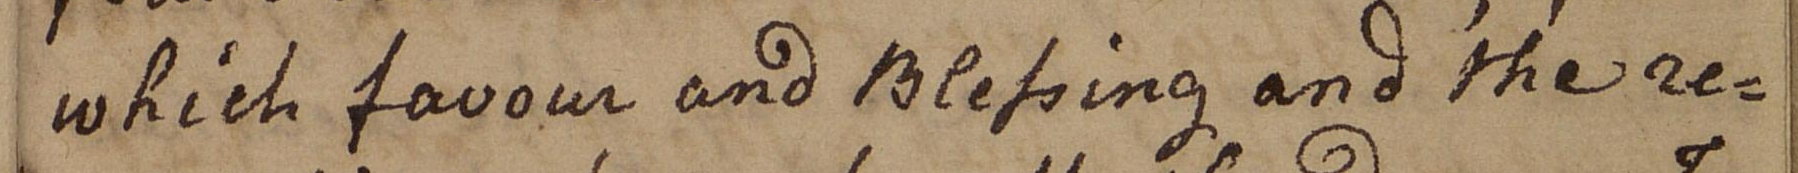which favour and Blessing and the re-
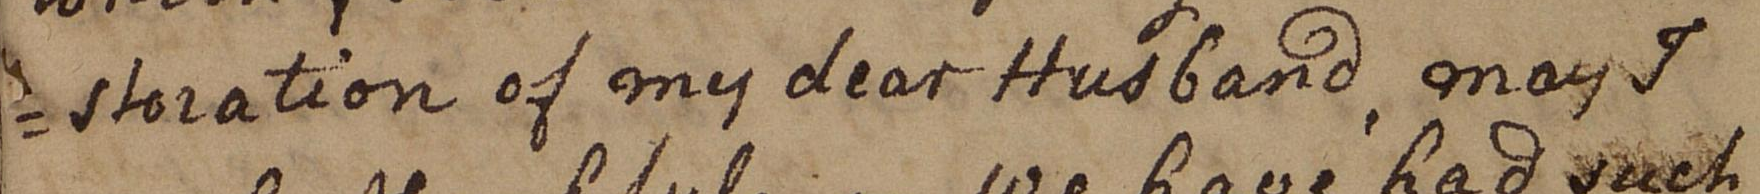-storation of my dear Husband, may I
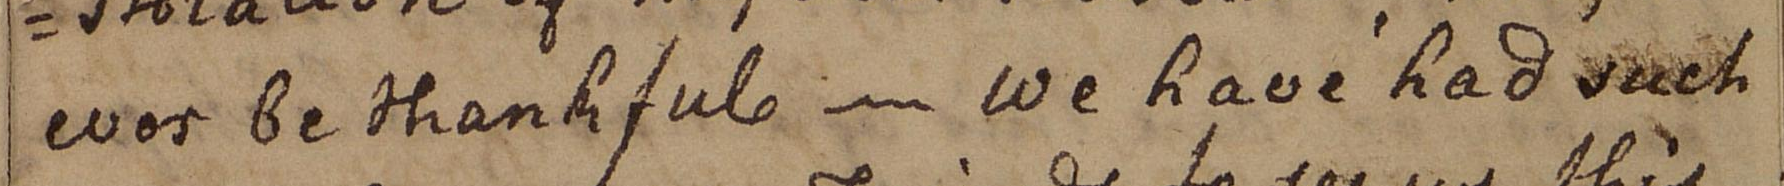ever be thankful- we have had such
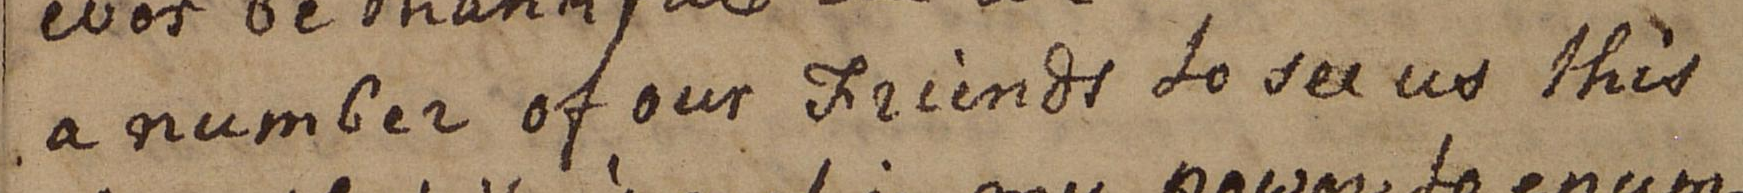a number of our Friends to see us this
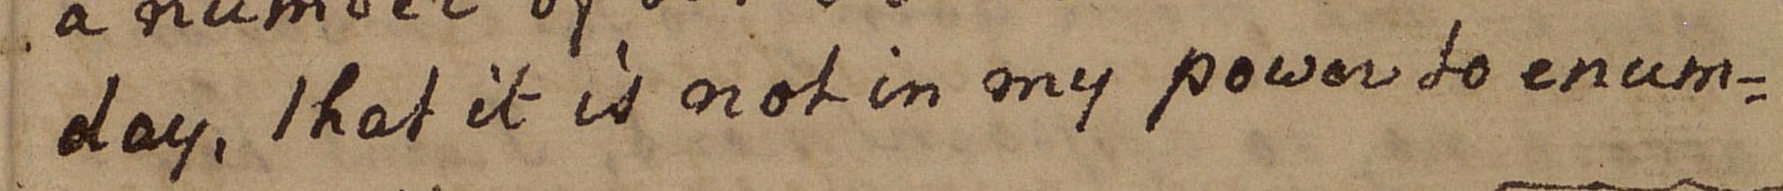day, that it is not in my power to enum-
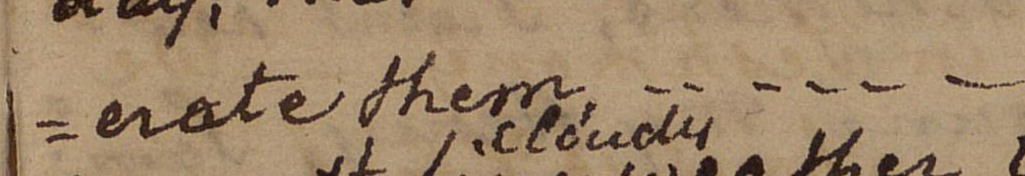-erate them- --- -
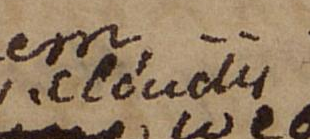,cloudy
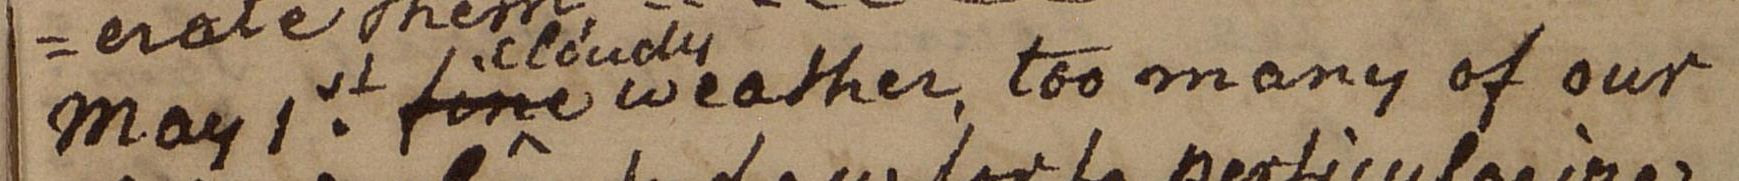May 1^st. Fine ^ weather, too many of our
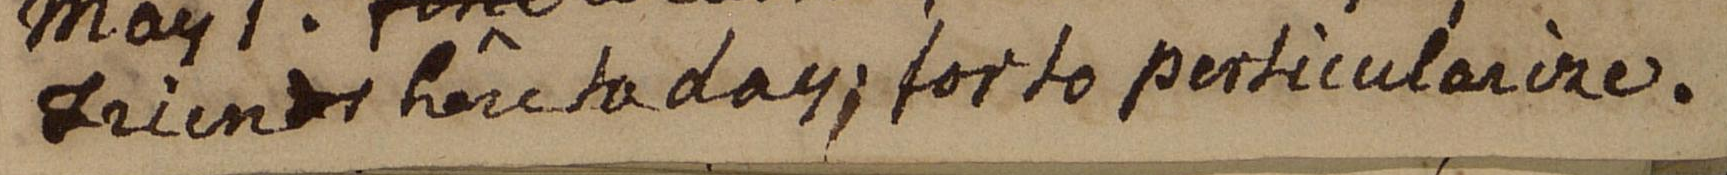Friends here to day; for to perticularize.
